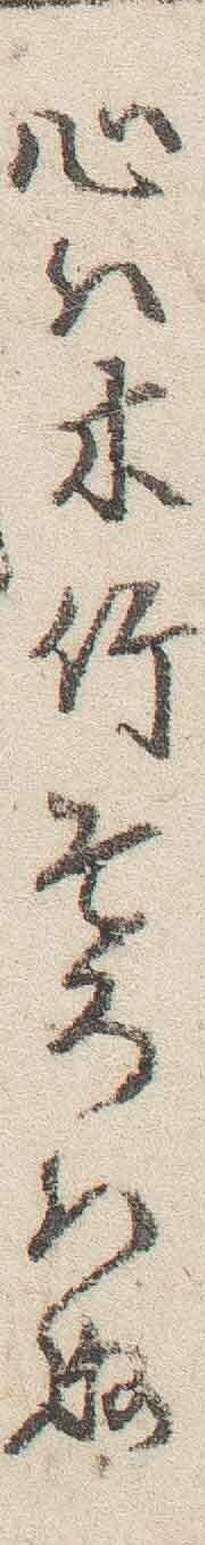心は木竹そろはぬ
